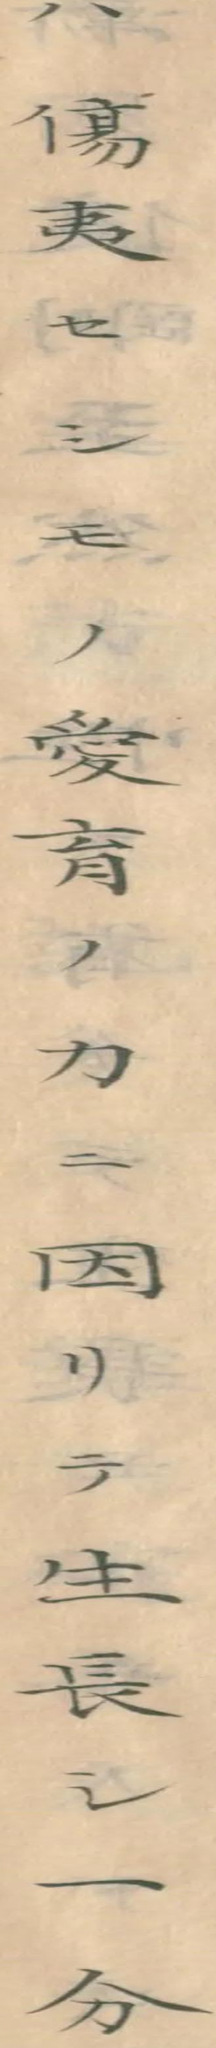ハ傷夷セシモノ愛育ノ力ニ因リテ生長シ一分

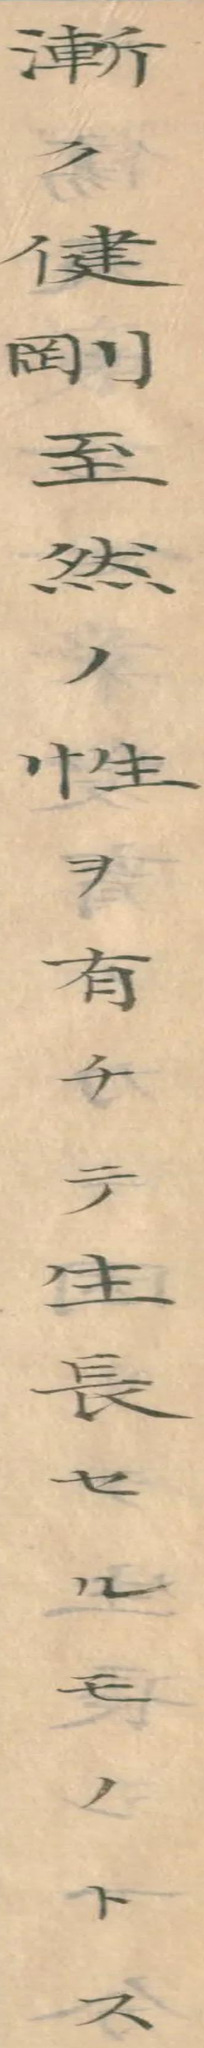漸ク健剛至然ノ性ヲ有チテ生長セルモノトス
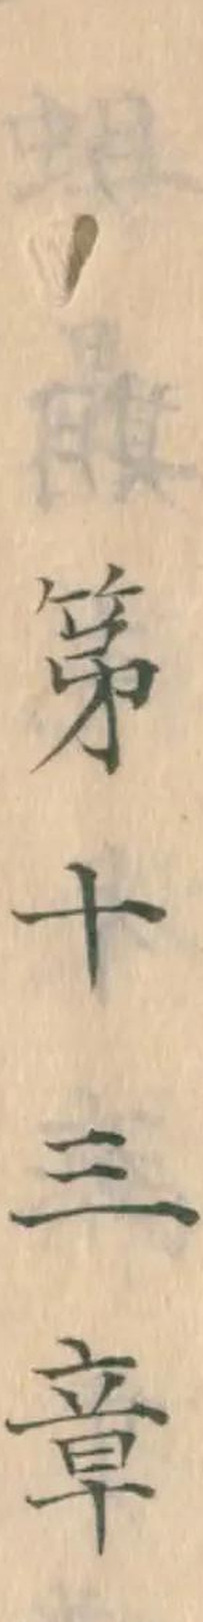第十三章
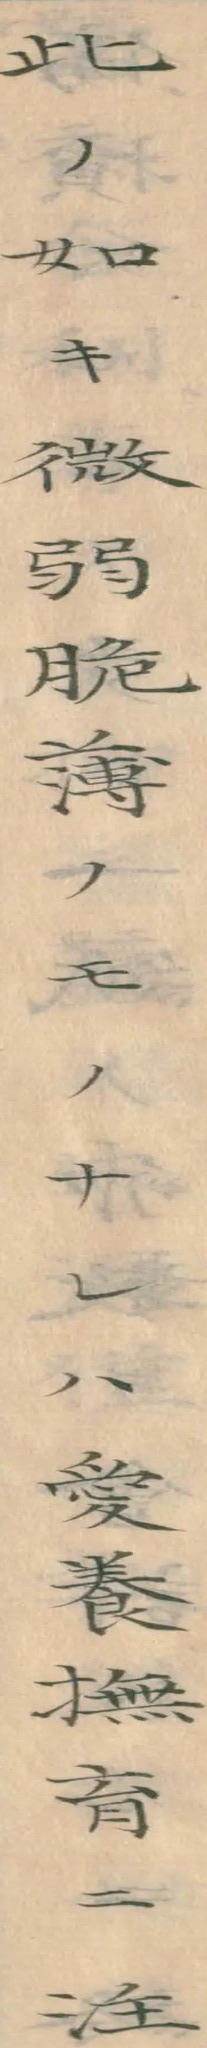此ノ如キ微弱脆薄ノモノナレハ愛養撫育ニ注
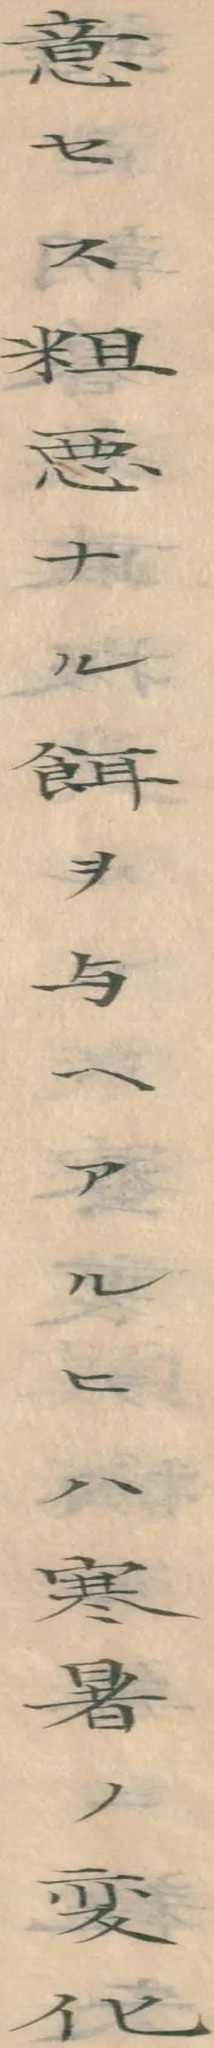意セス粗悪ナル餌ヲ与ヘアルヒハ寒暑ノ変化
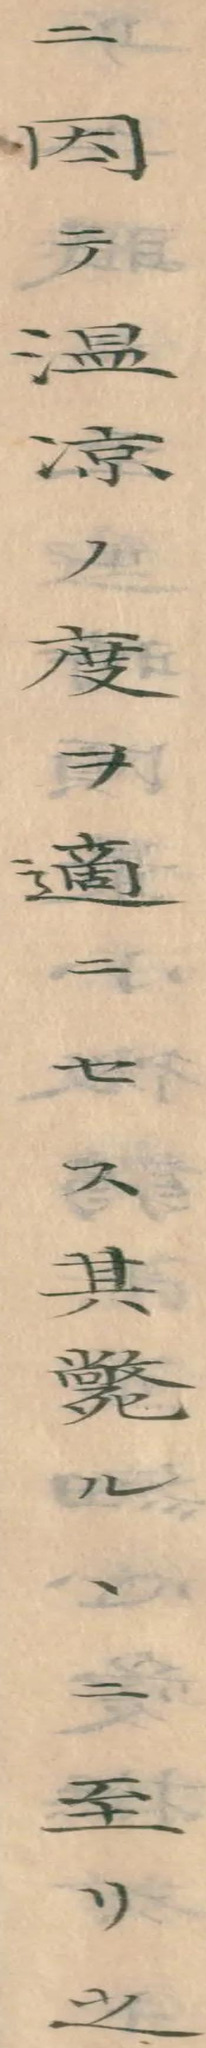ニ因テ温涼ノ度ヲ適ニセス其斃ルヽニ至リ之
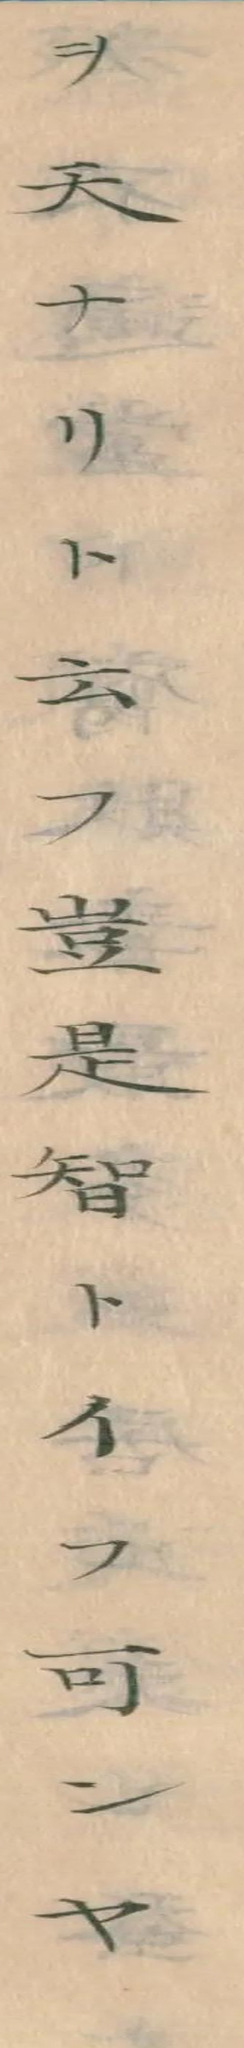ヲ天ナリト云フ豈是智トイフ可ンヤ
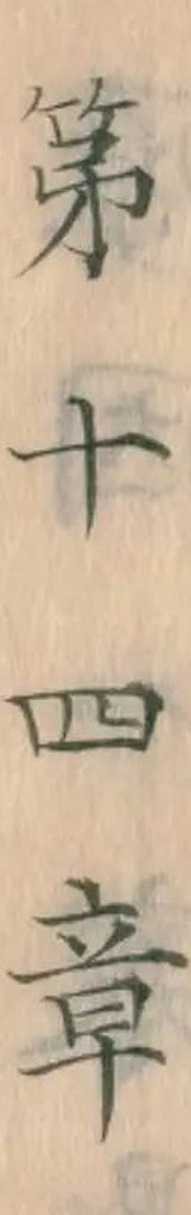第十四章
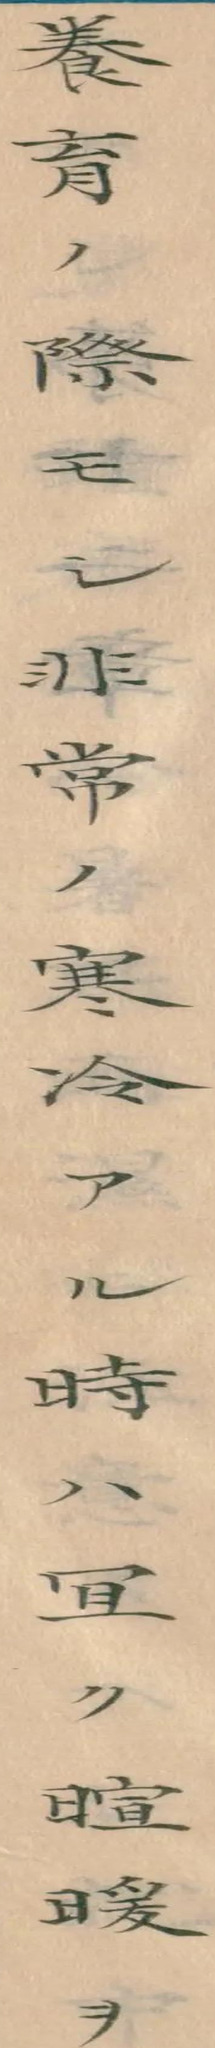養育ノ際モシ非常ノ寒冷アル時ハ宜ク暄暖ヲ
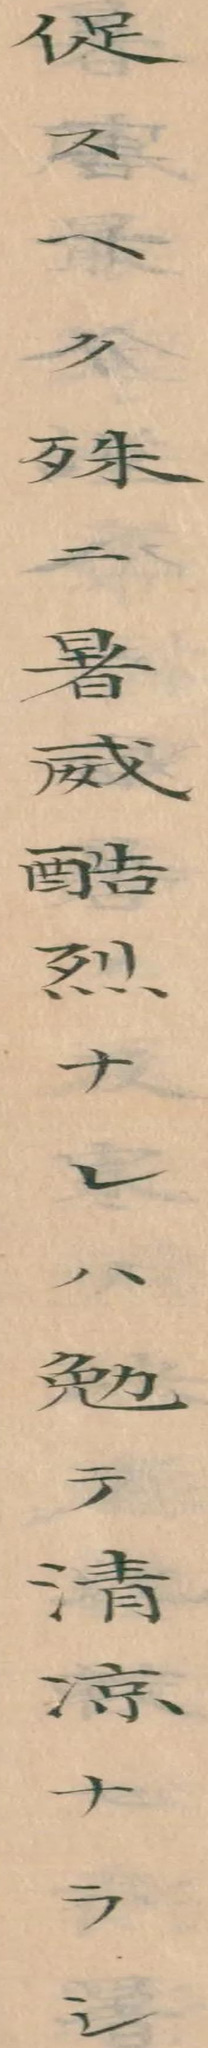促スヘク殊ニ暑威酷烈ナレハ勉テ清涼ナラシ
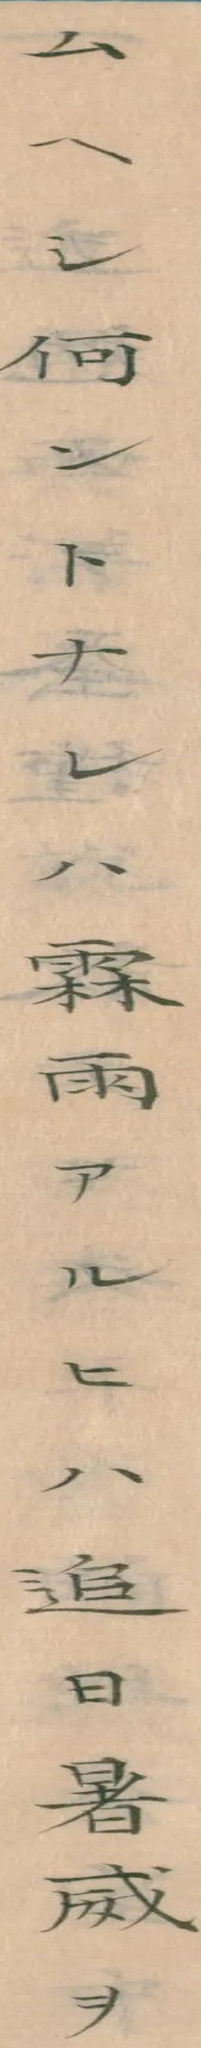ムヘシ何ントナレハ霖雨アルヒハ追日暑威ヲ
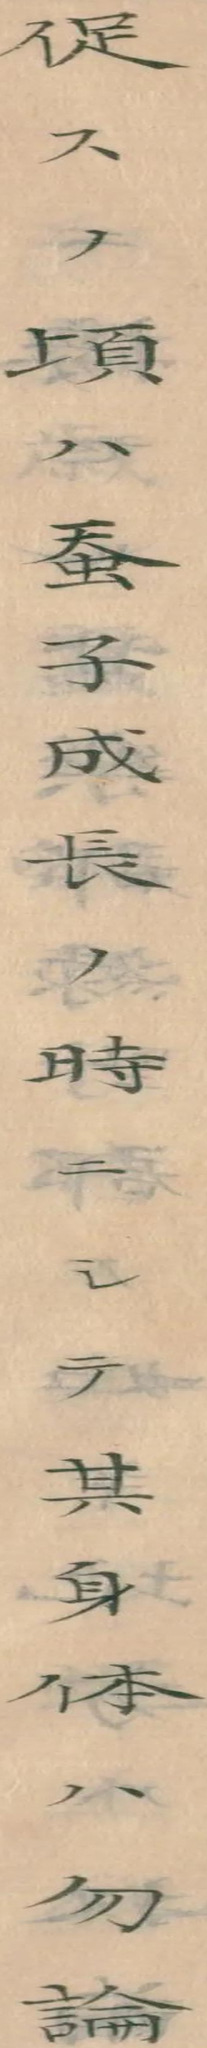促スノ頃ハ蚕子成長ノ時ニシテ其身体ハ勿論
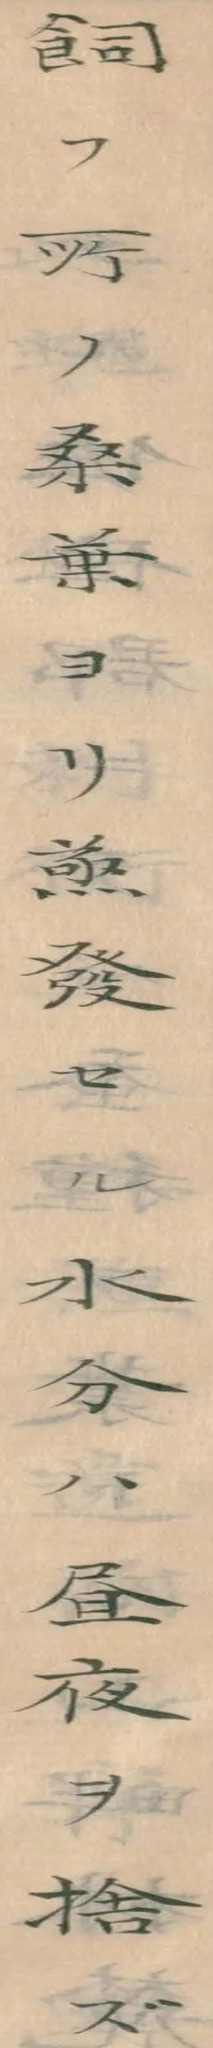飼フ所ノ桑葉ヨリ蒸発セル水分ハ昼夜ヲ捨ズ
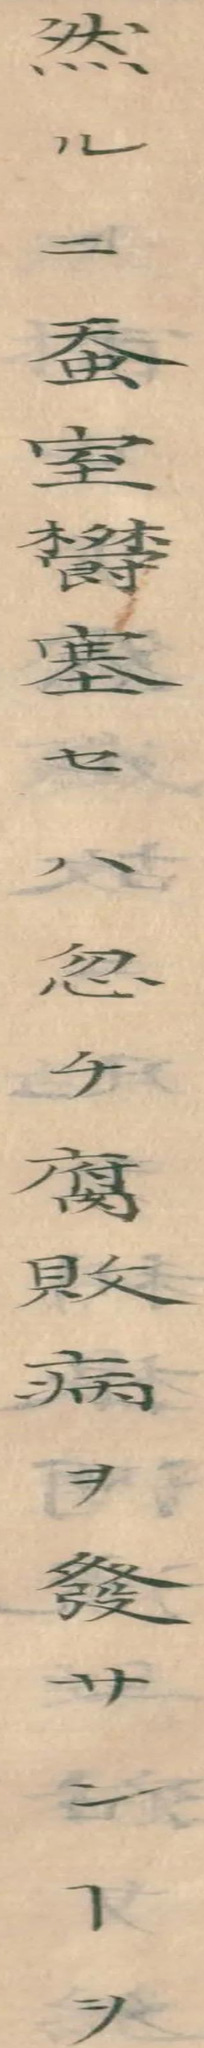然ルニ蚕室鬱塞セハ忽チ腐敗病ヲ発サンコトヲ
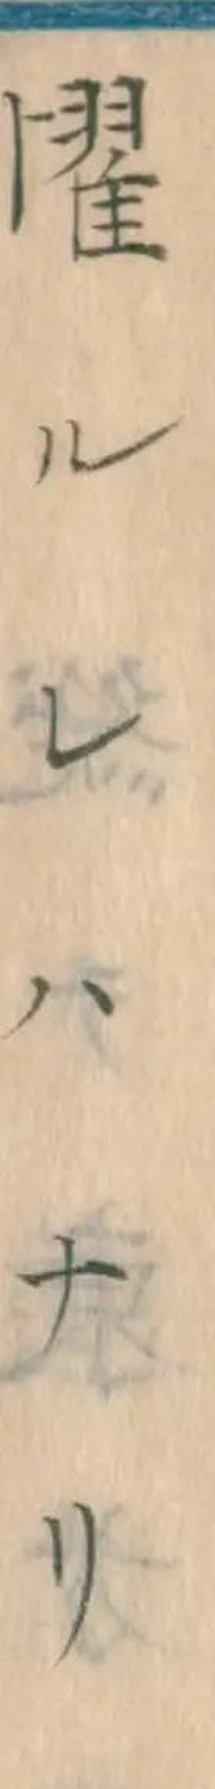懼ルレハナリ
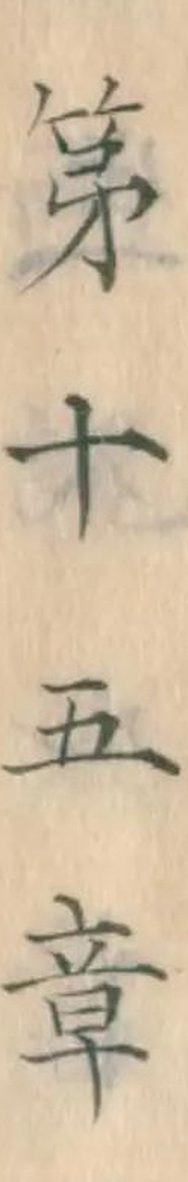第十五章
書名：蚕桑集成
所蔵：国立国会図書館 National Diet Library, JAPAN
